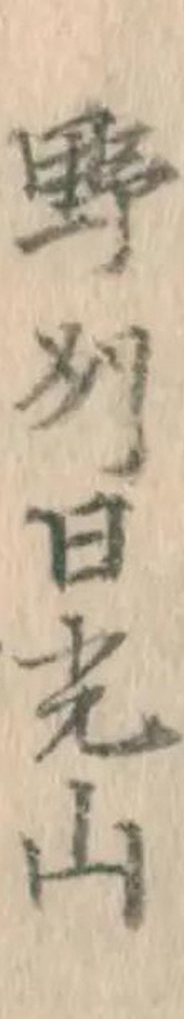野州日光山
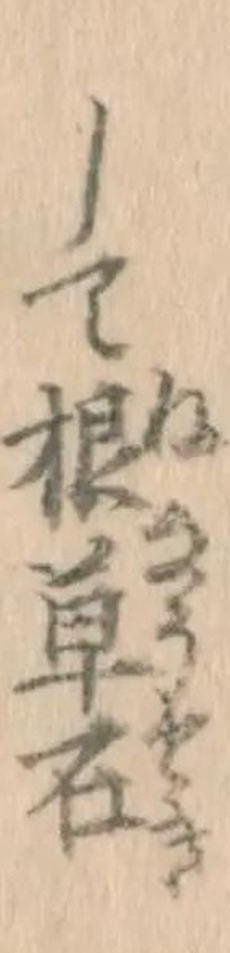して根草石
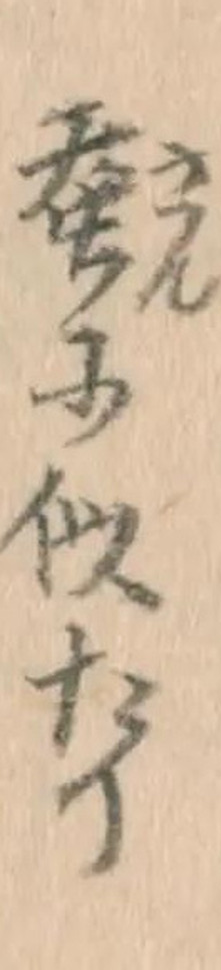蚕に似たり

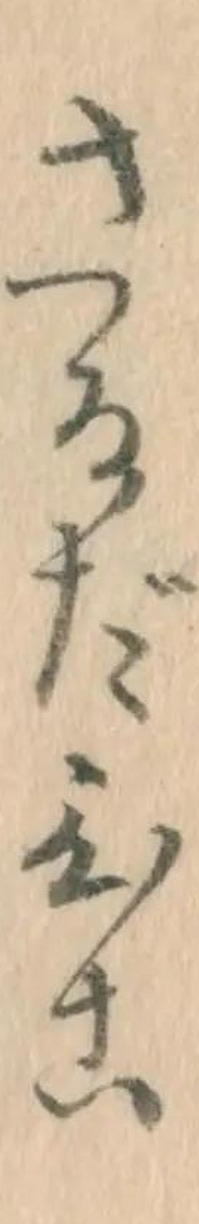さるだひこ
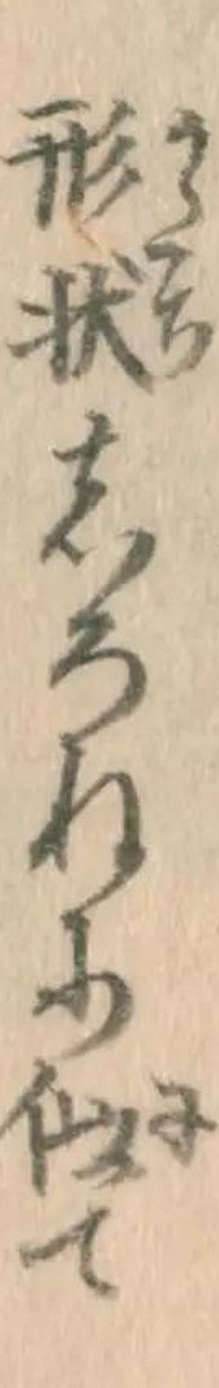形状しろねに似て
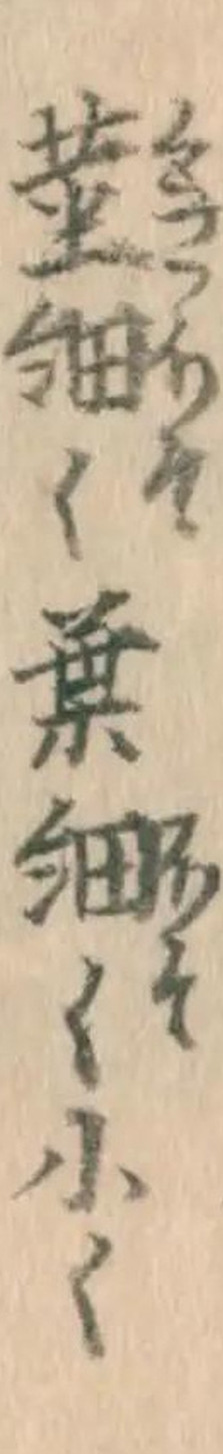茎細く葉細く小く
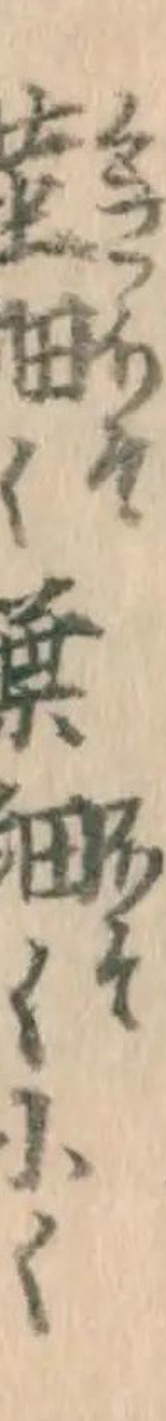茎細く葉細く小く
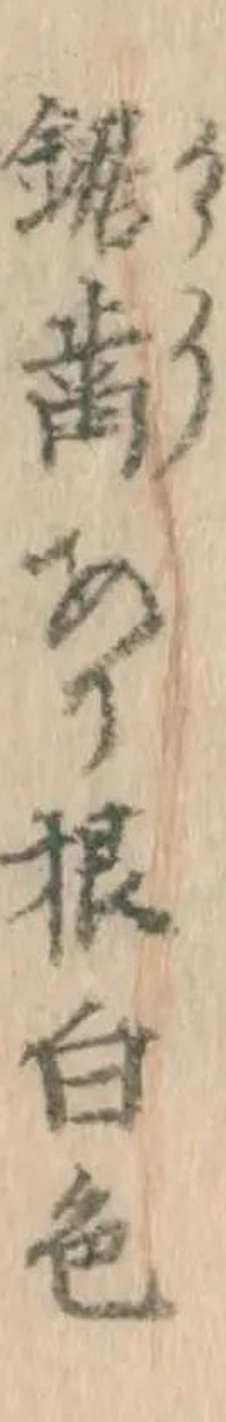鋸歯あり根白色
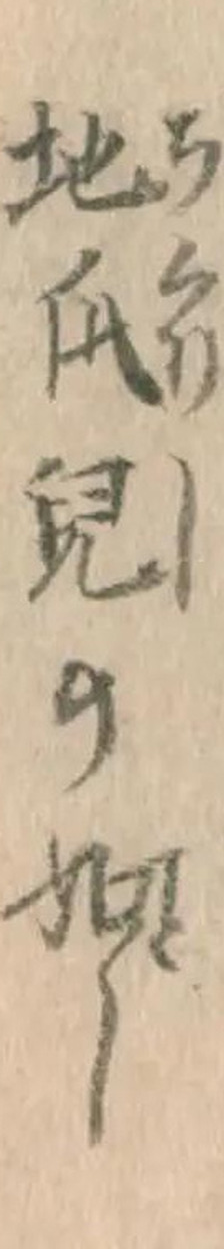地瓜児の如し
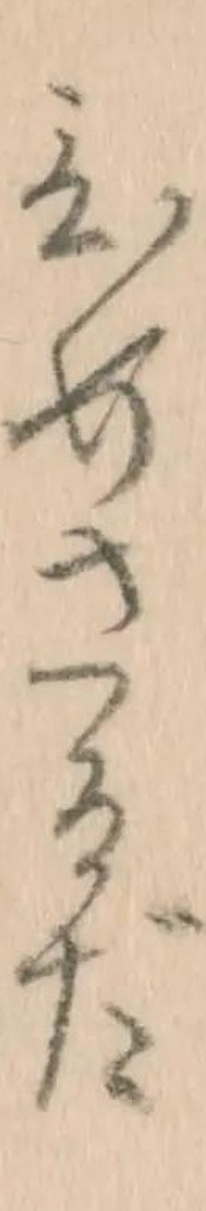ひめさるだ
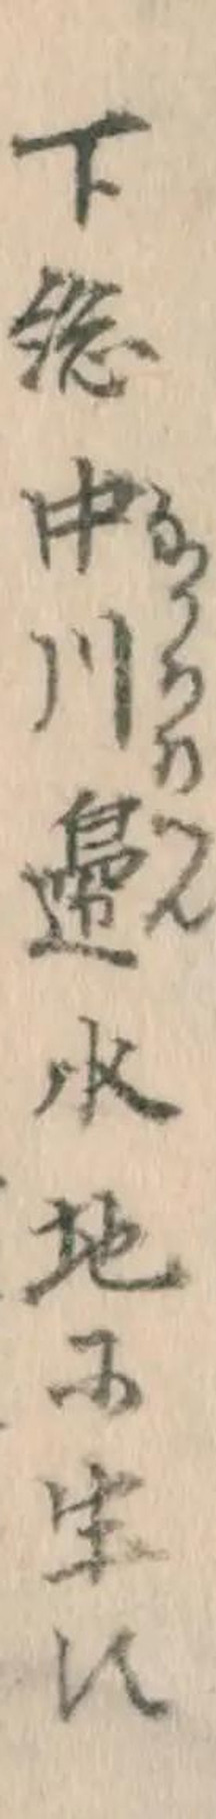下総中川辺水地に生す
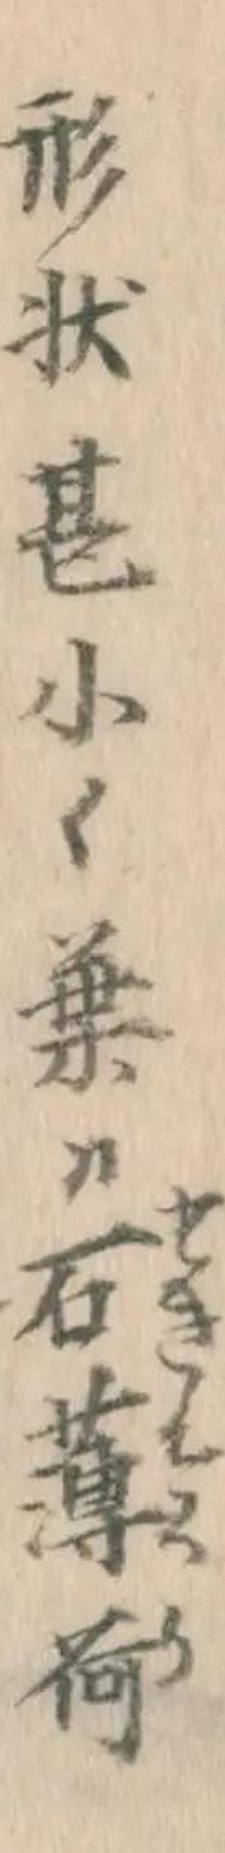形状甚小く葉は石薄荷
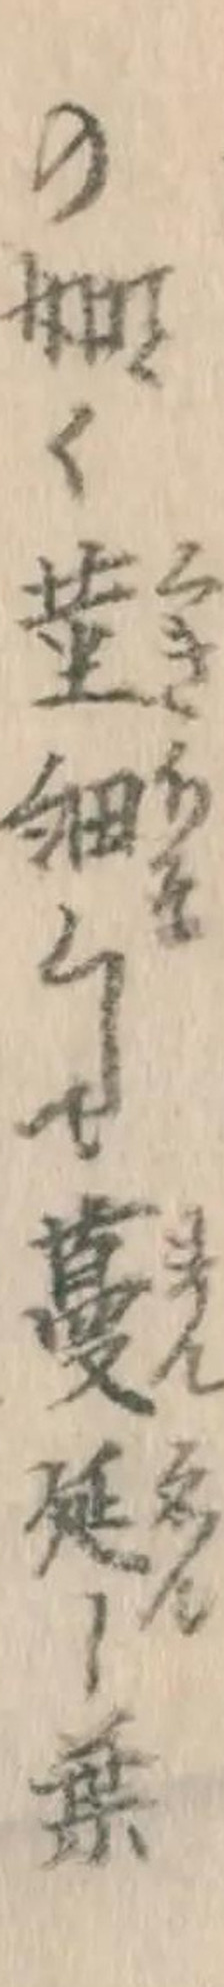の如く茎細くして蔓延し葉
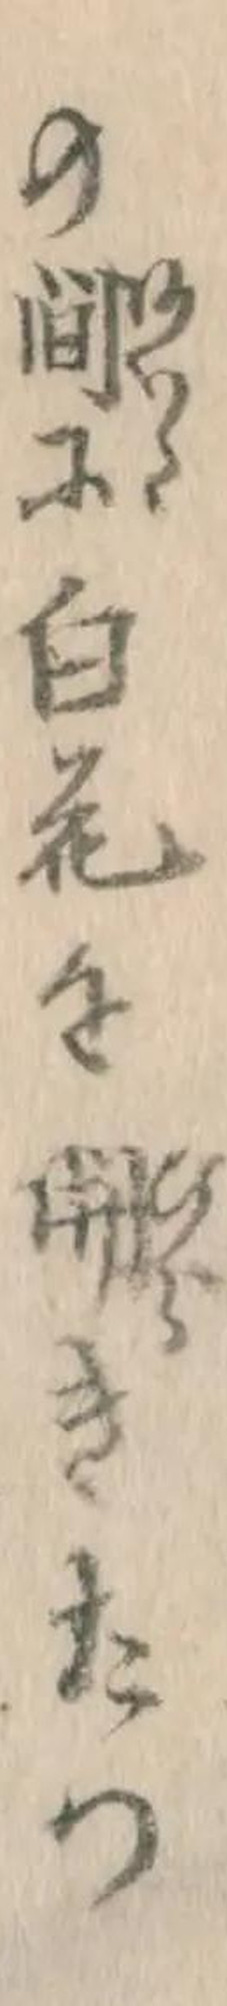の間に白花を開きたつ
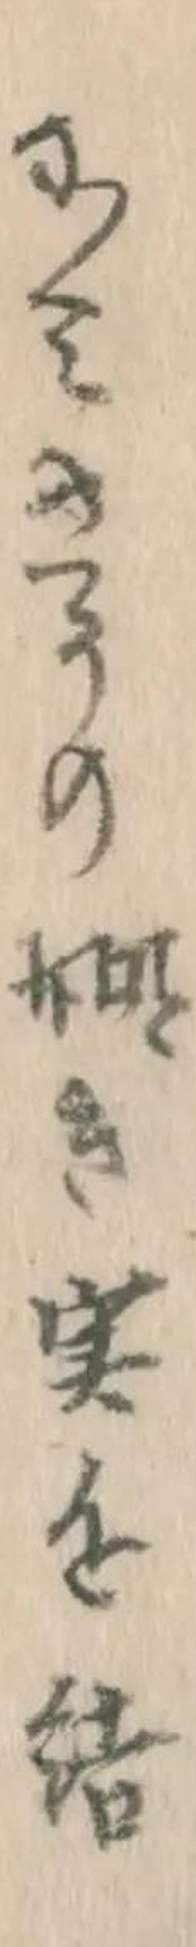なみさうの如き実を結
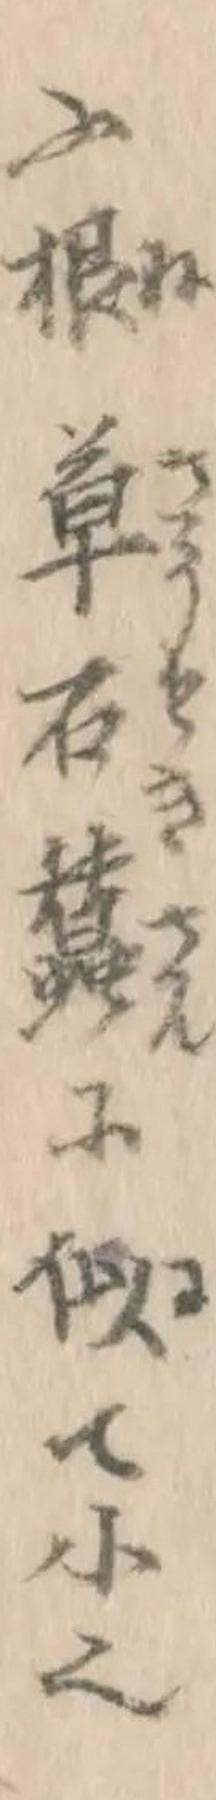ふ根草石蚕に似て小也
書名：本草図譜. 巻52-54
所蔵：国立国会図書館 National Diet Library, JAPAN
